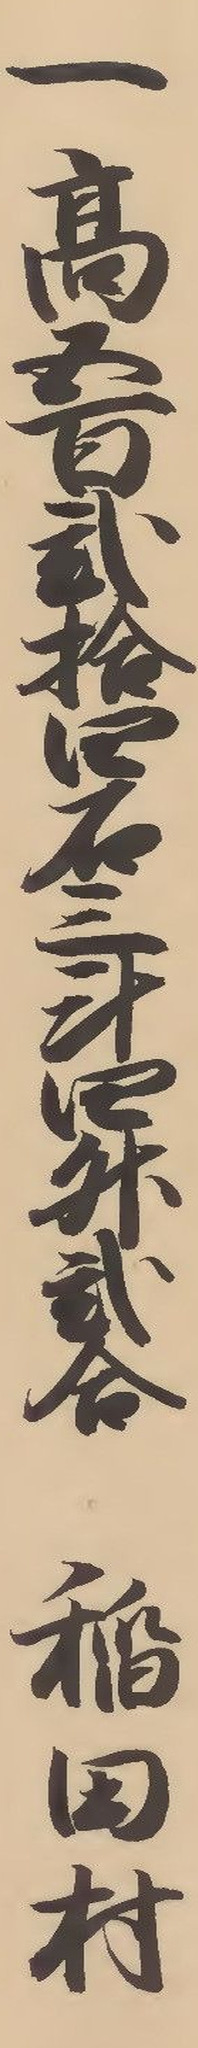一高五百弐拾四石三斗四升弐合稲田村
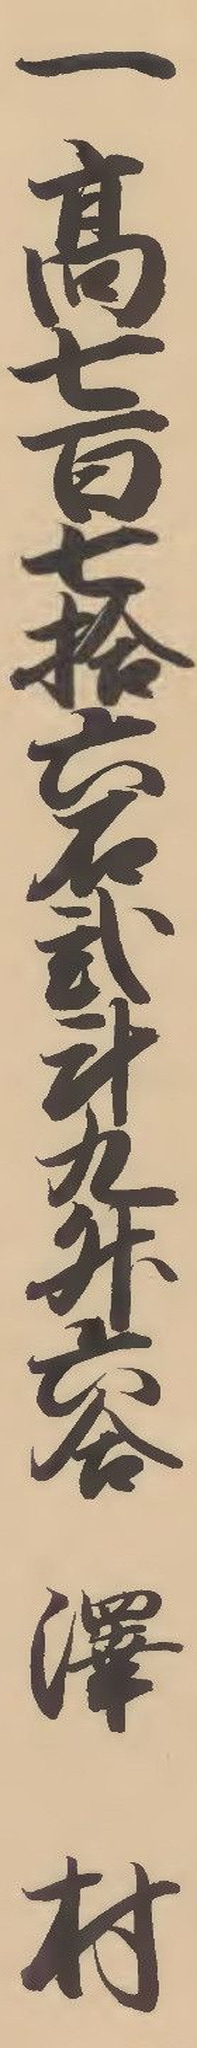一高七百七拾六石弐斗九升六合沢村
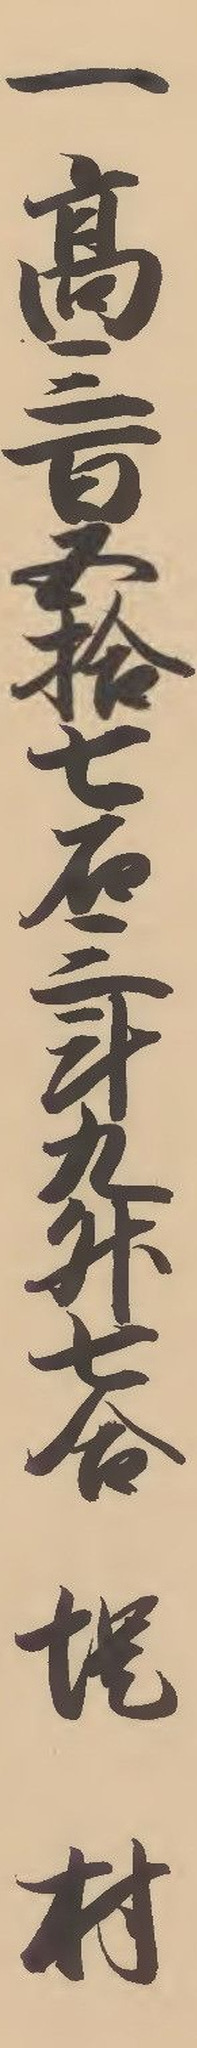一高三百五拾七石三斗九升七合堤村

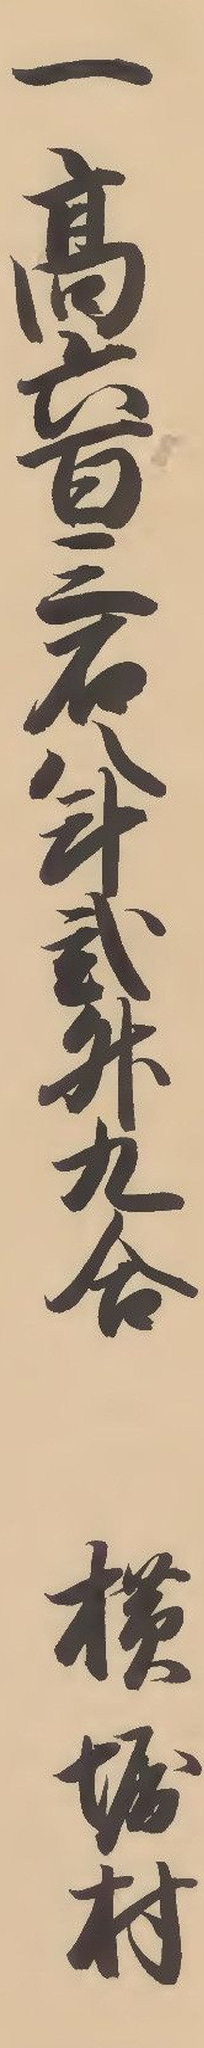一高六百三石八斗弐升九合横堀村
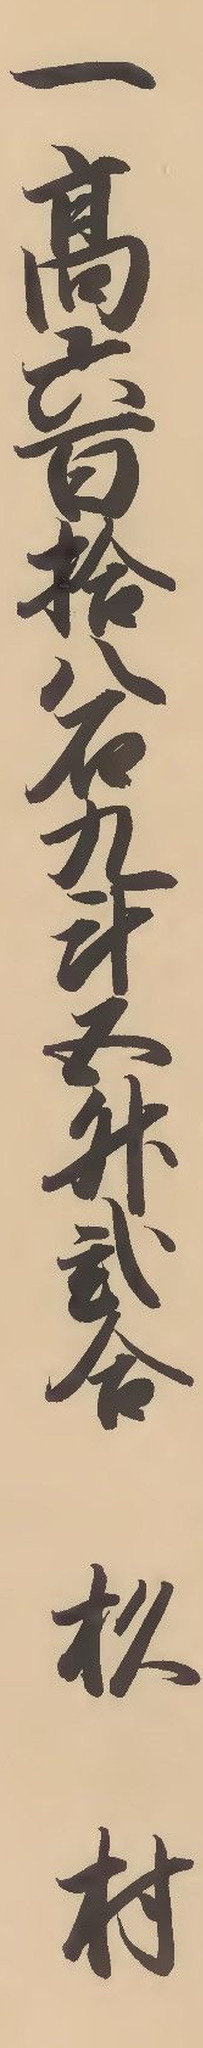一高六百拾八石九斗五升弐合杉村
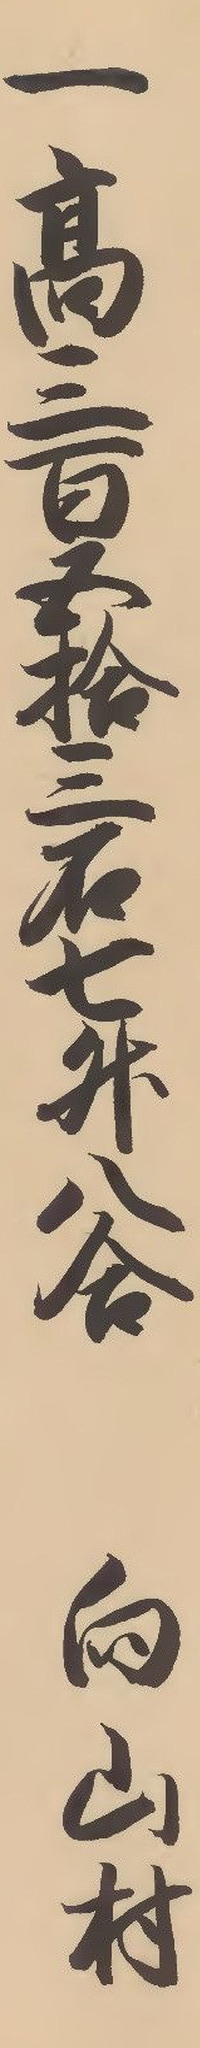一高三百五拾三石七升八合向山村
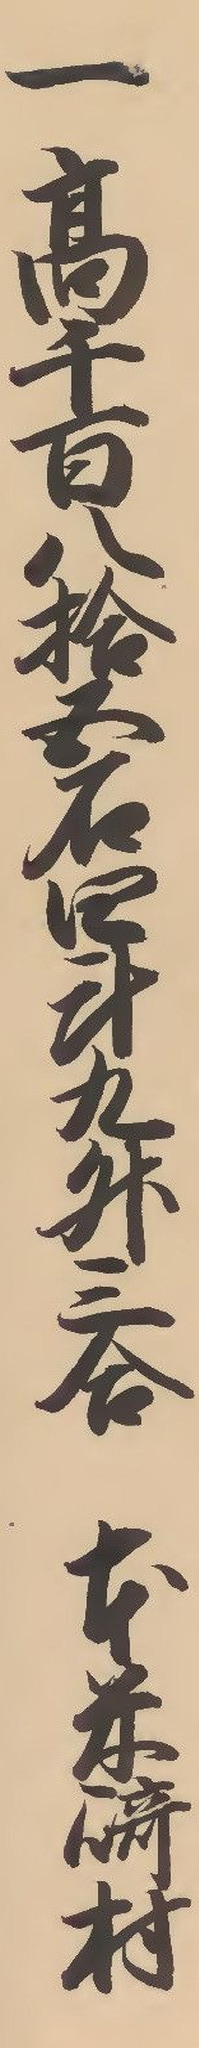一高千百八拾五石四斗九升三合本米崎村
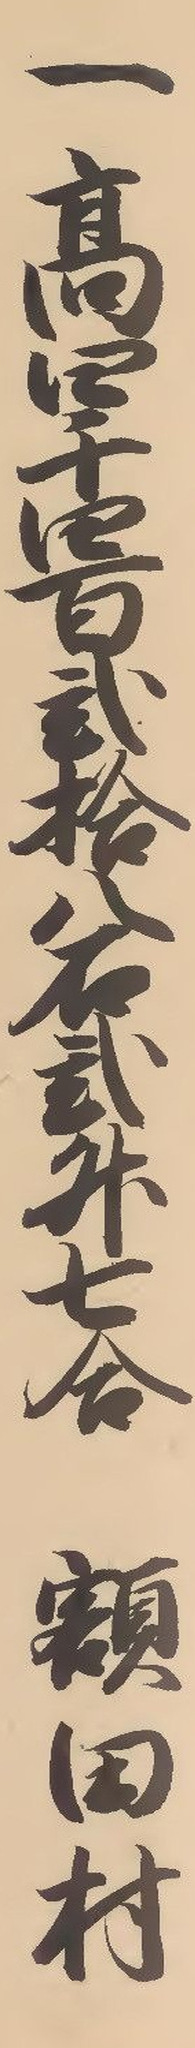一高四千四百弐拾八石弐升七合額田村
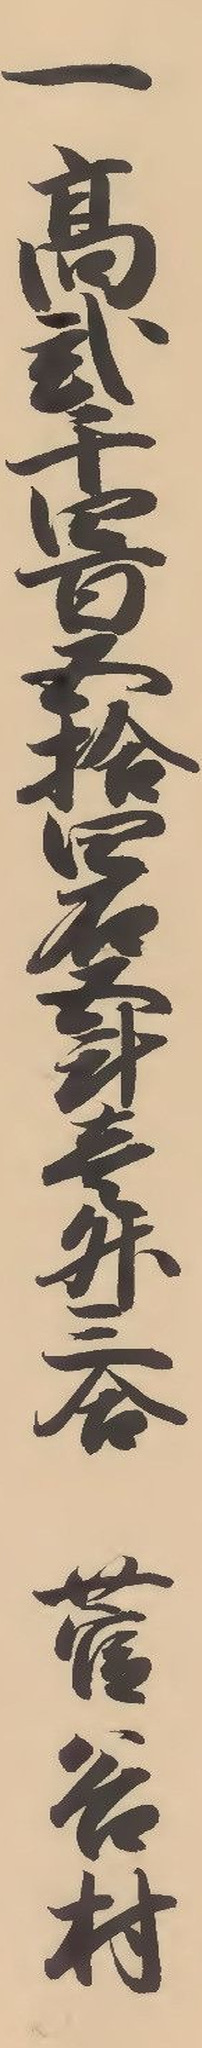一高弐千四百五拾四石五斗壱升三合菅谷村
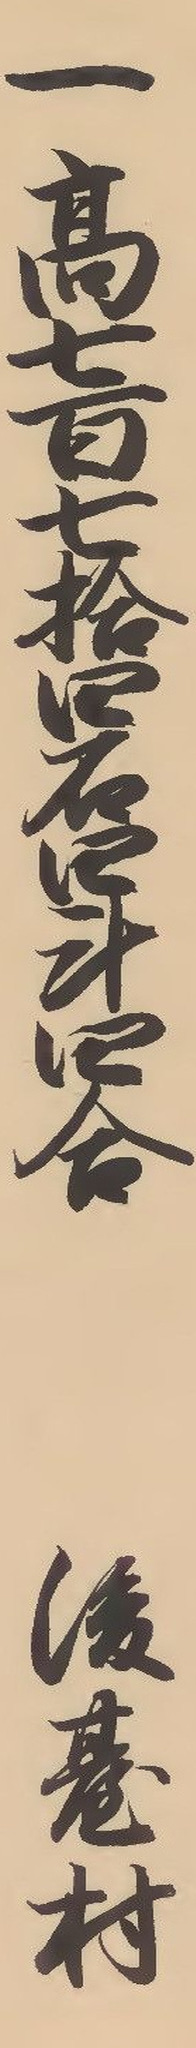一高七百七拾四石四斗四合後台村
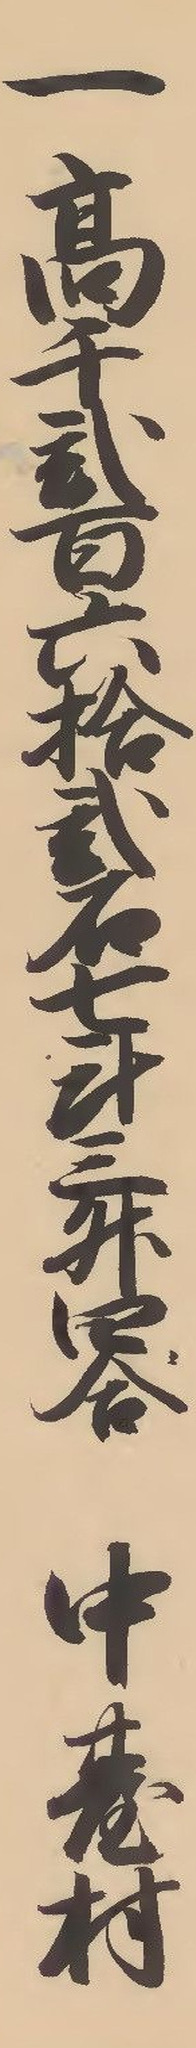一高千弐百六拾弐石七斗三升四合中台村

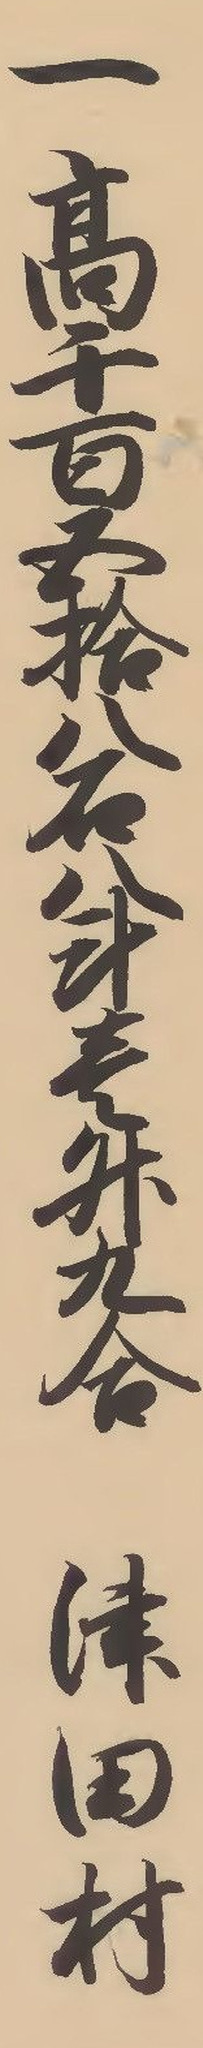一高千百五拾八石八斗壱升九合津田村
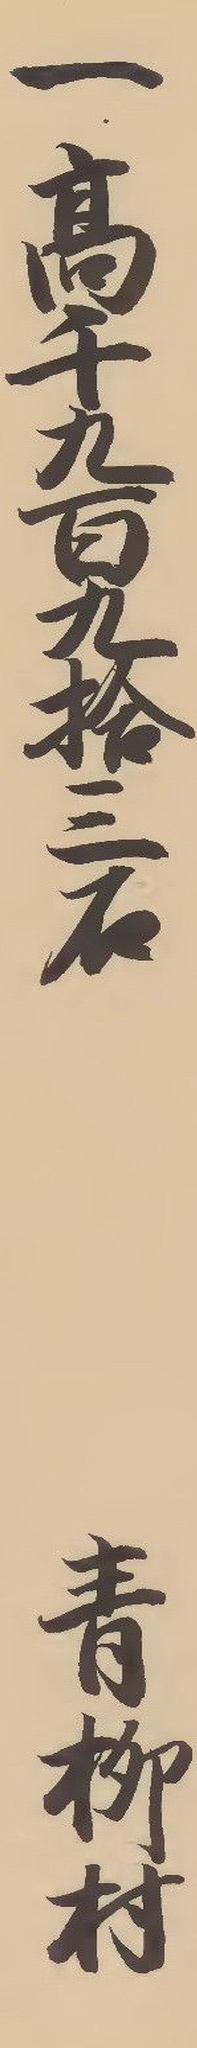一高千九百九拾三石青柳村
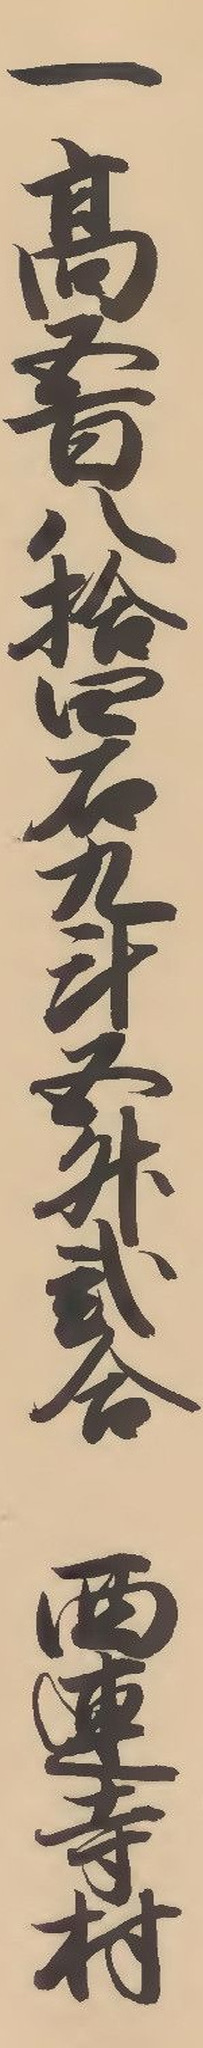一高五百八拾四石九斗五升弐合西連寺村
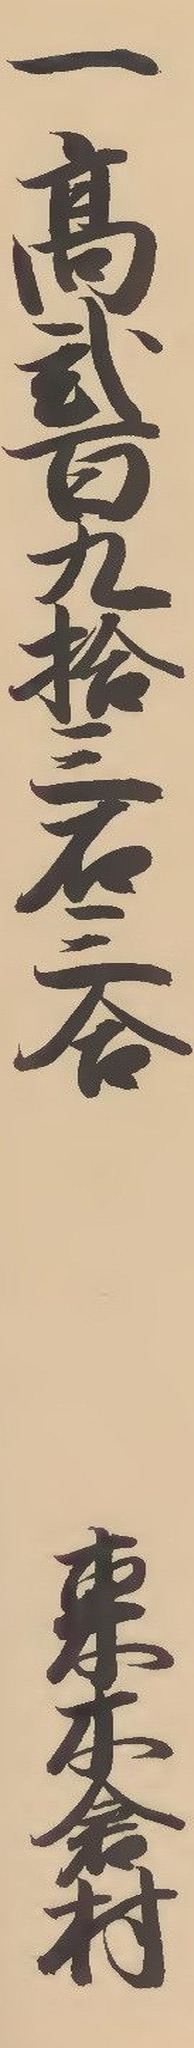一高弐百九拾三石三合東木倉村
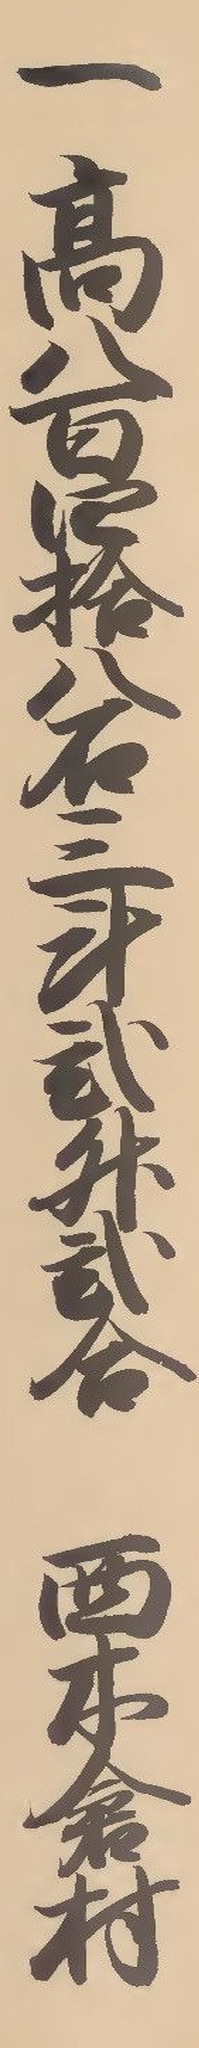一高八百四拾八石三斗弐升弐合西木倉村
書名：常陸国郷帳
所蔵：国立公文書館 National Archives of Japan
